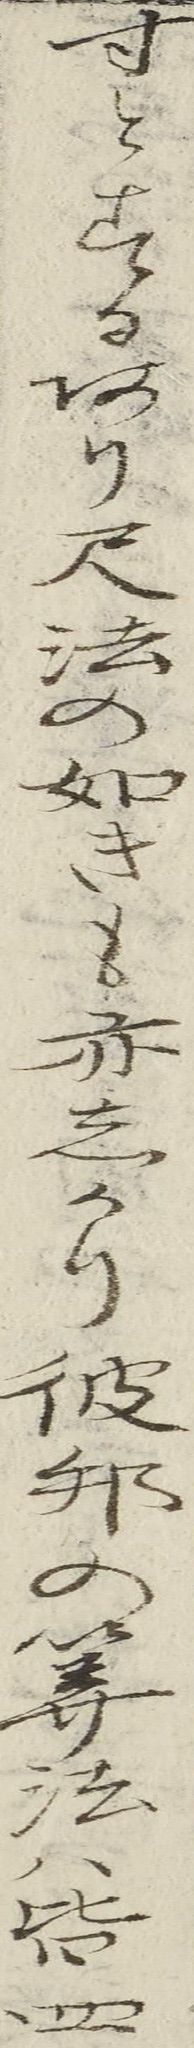寸とするあり尺法の如きも亦しかり彼邦の算芳ハ皆四
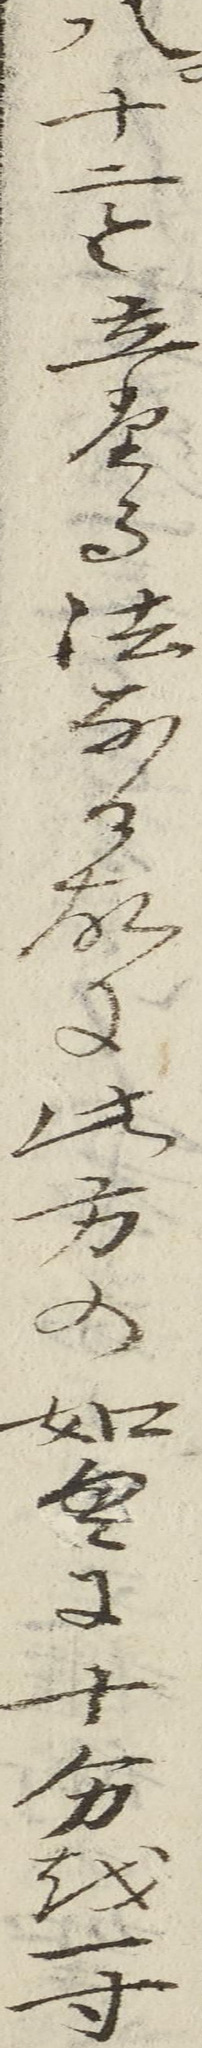八。十二と立たる法なる故に此方の如きに十分を一寸

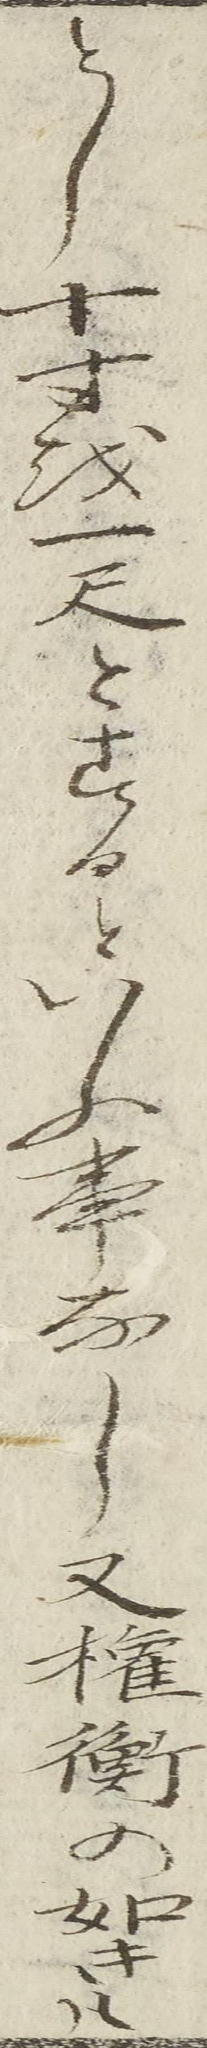とし十寸を一尺とするといふ事なし又権衛の如きも
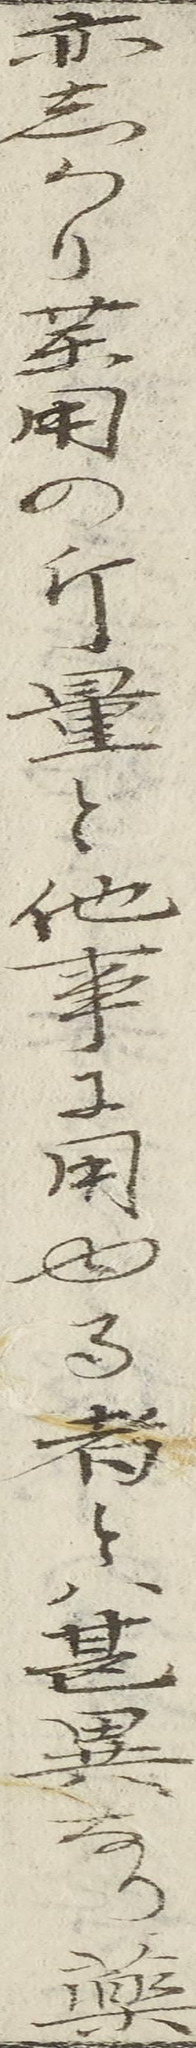亦しかり薬用の斤量と他事に用ゆる者とハ甚異なり薬
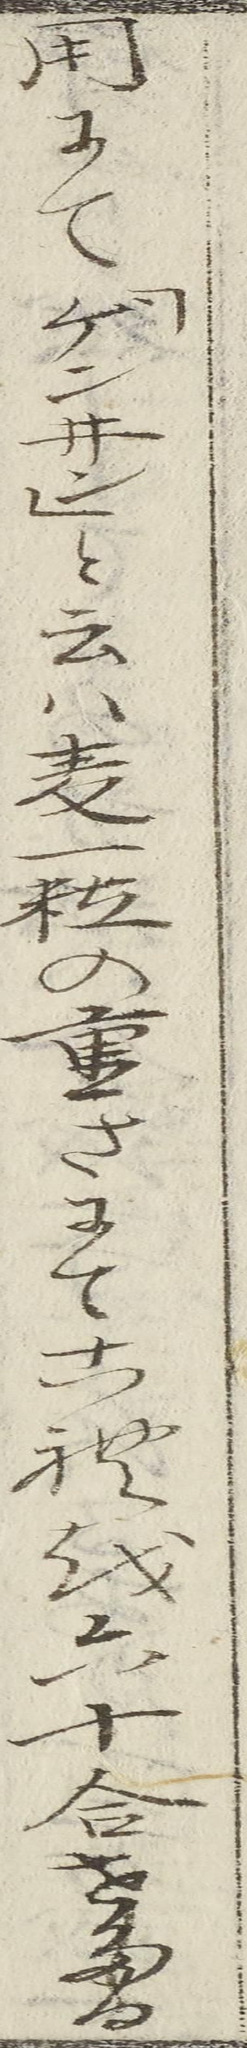用にて「ゲン井ン」と云ハ麦一粒の重さにてこれを六十合せたる
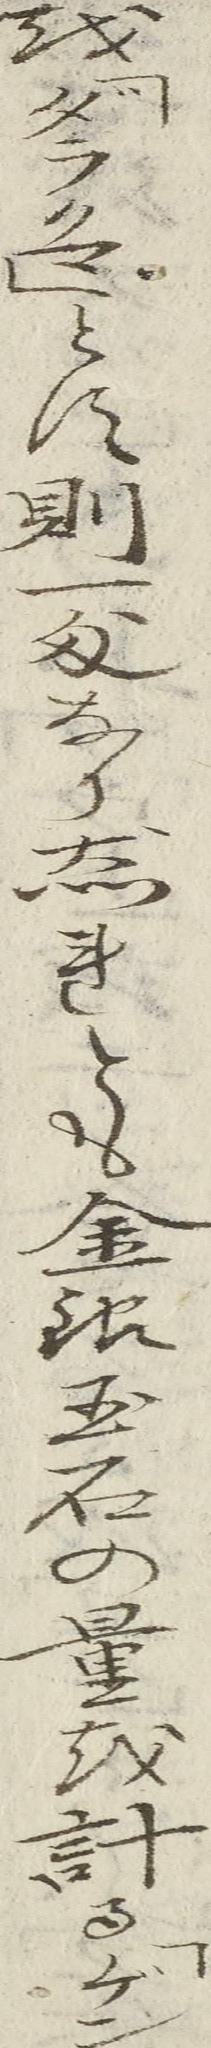を「ダラクマ」とす則一匁なり然れとも金銀玉石の量を計る「ゲン
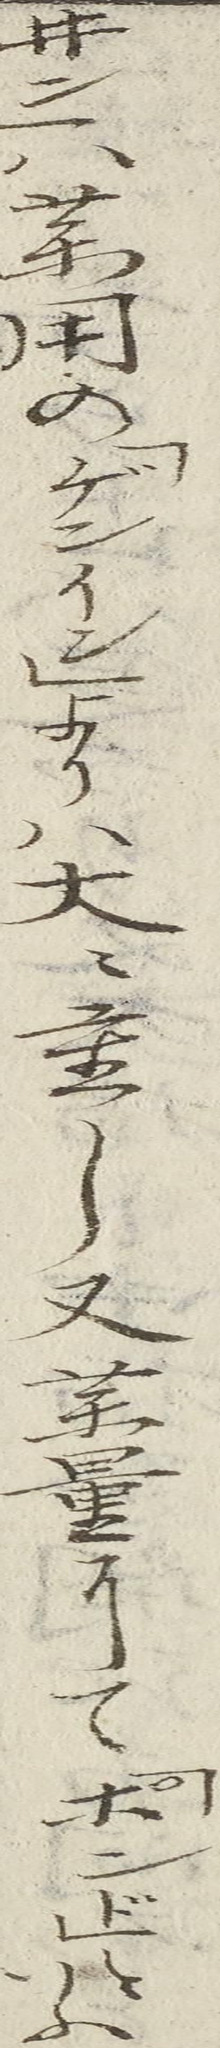井ン」ハ薬用の「ゲンイン」よりハ大二重し又薬量にて「ポンド」といふ
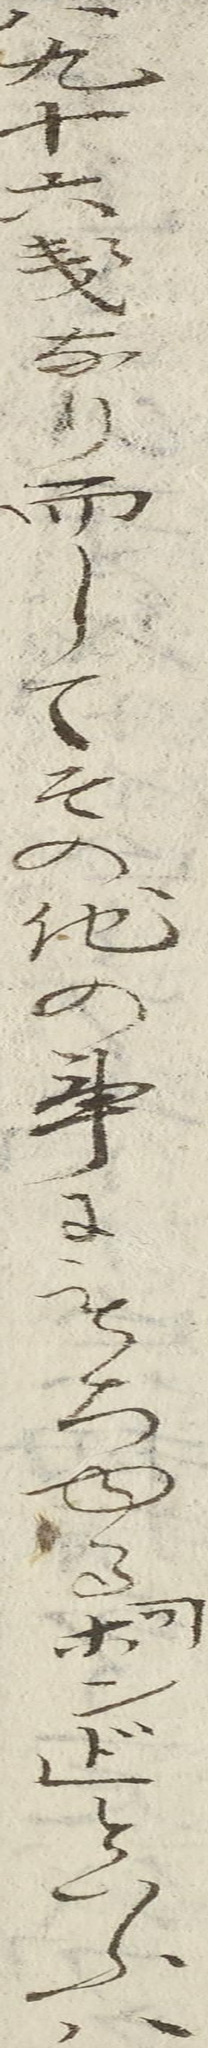ハ九十六銭なり而してその他の事にもちゆる「ポンド」といふハ
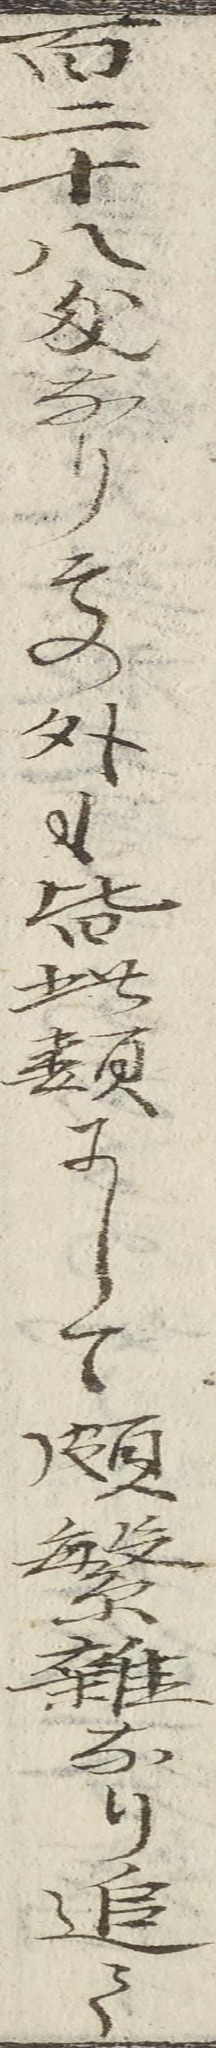百二十八匁なりその外も皆此類にして頗繁雑なり追て
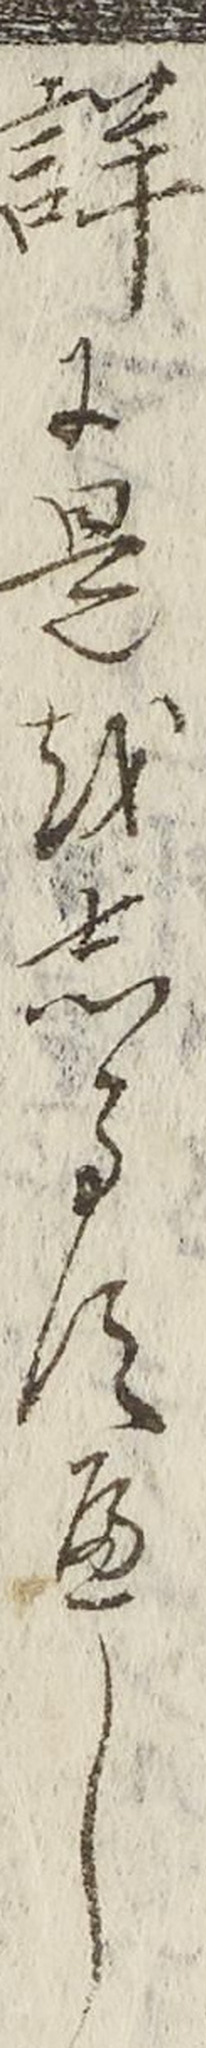詳に是をしるすへし
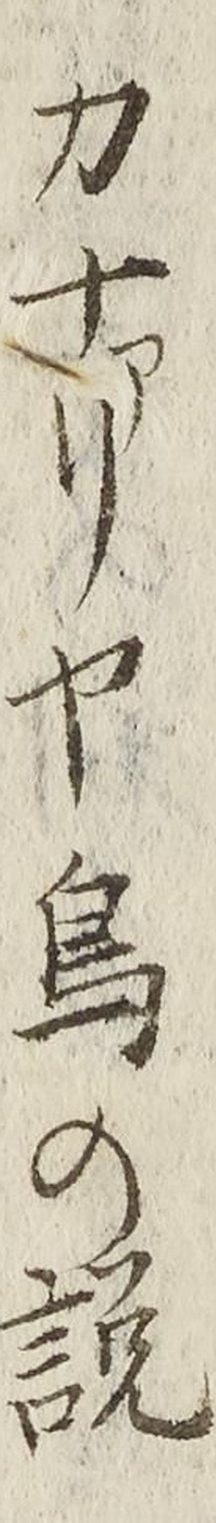カナアリヤ鳥の説
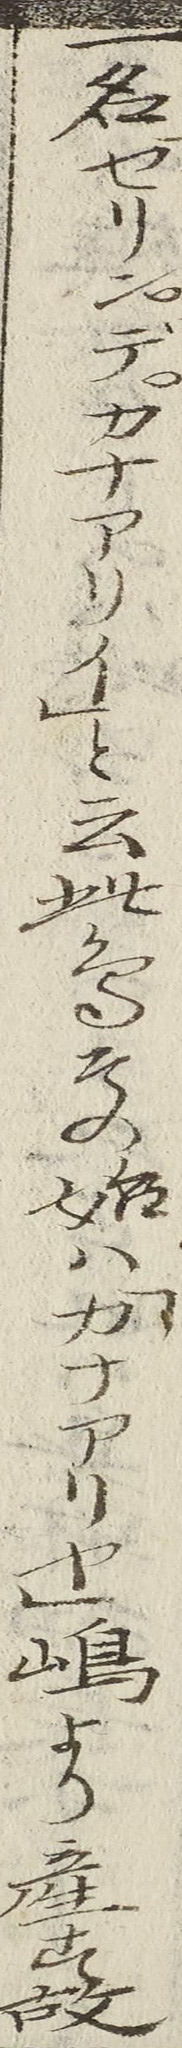一名「セリン。デ。カナアリイ」と云此鳥その始ハ「カナアリア」嶋より産す故
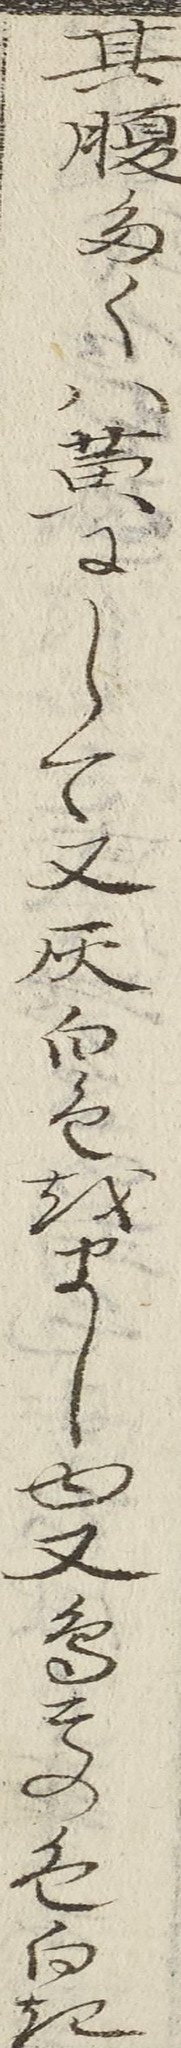その腹多くハ黄にして又灰白色をましゆ又鳥その色白き
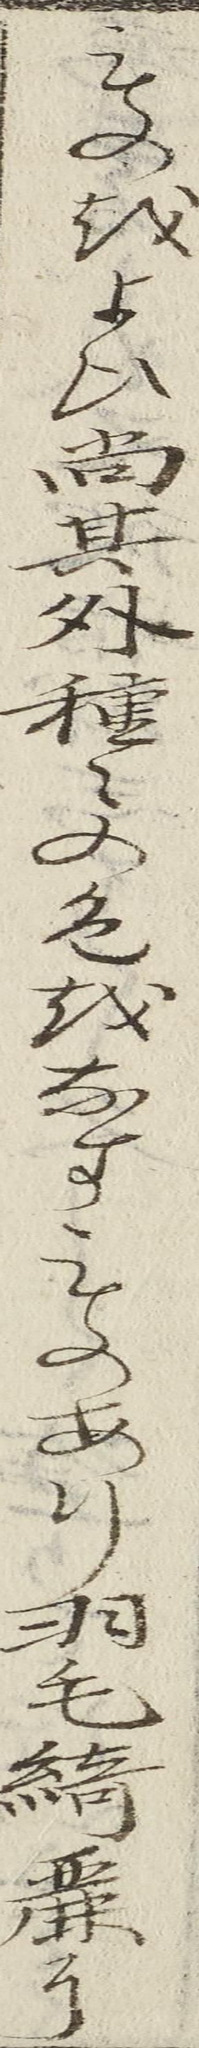ものをよひ尚其外種々の色をなすものあり羽毛綺麗に
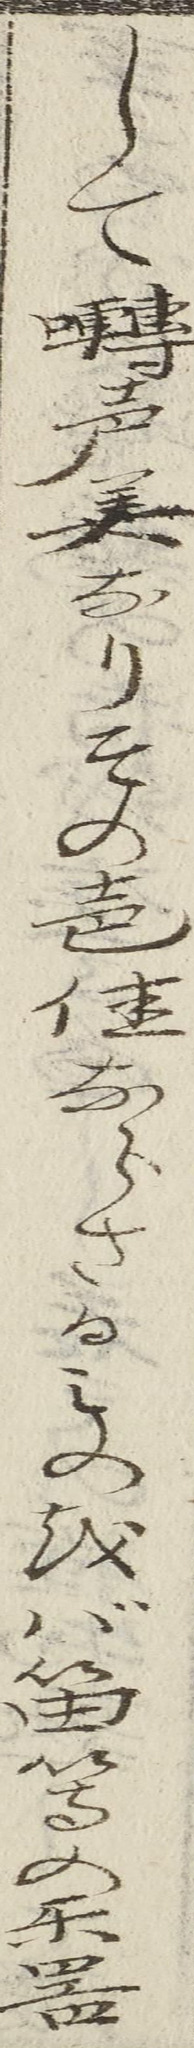して囀声美なりその声佳ならさるものをバ笛等の楽器
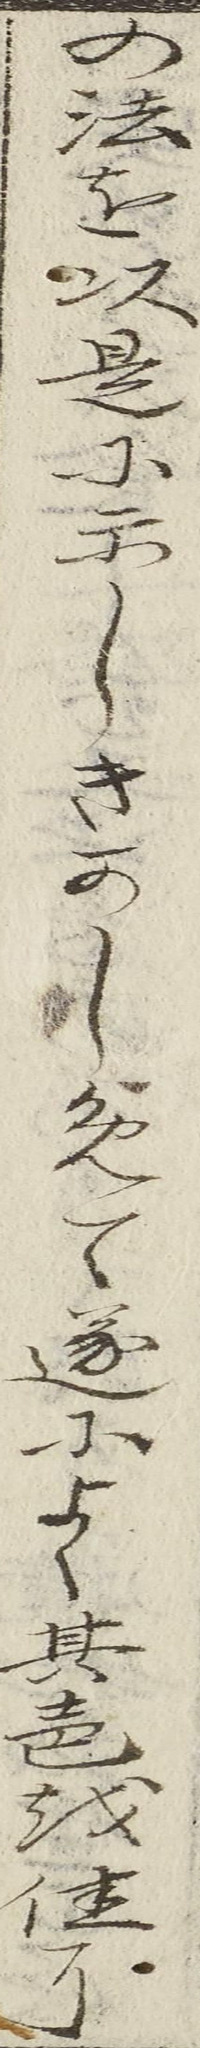の法を以是に示しきかしめて遂によく其声を佳に
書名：西洋雜記　坤
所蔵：東京大学地震研究所図書室 Earthquake Research Institute Library, The University of Tokyo, JAPAN
